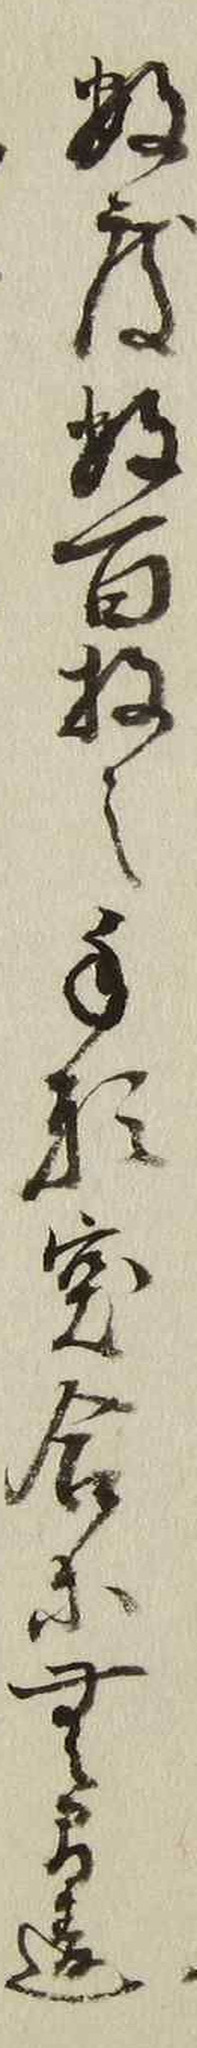数度数百枚之手形突合等無間違
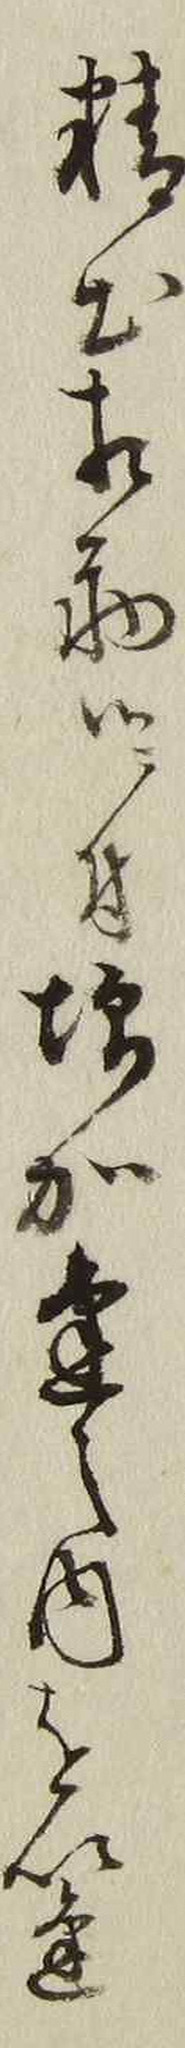精出相勤候ニ付増加金之内を以金
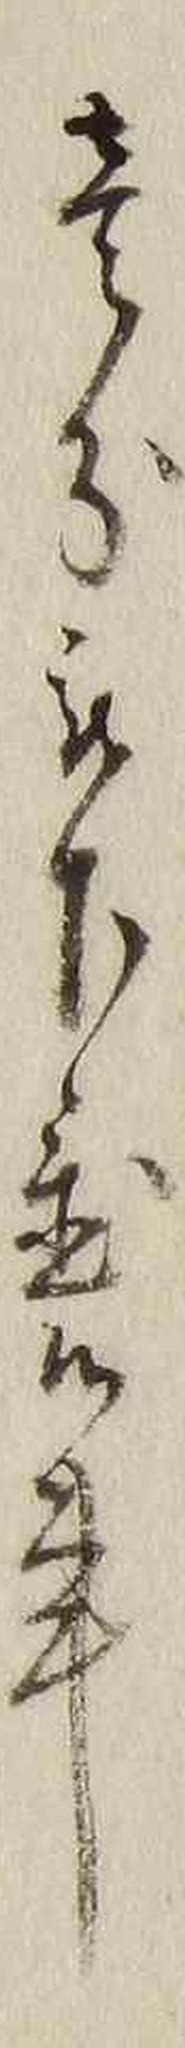壱分被下置候事
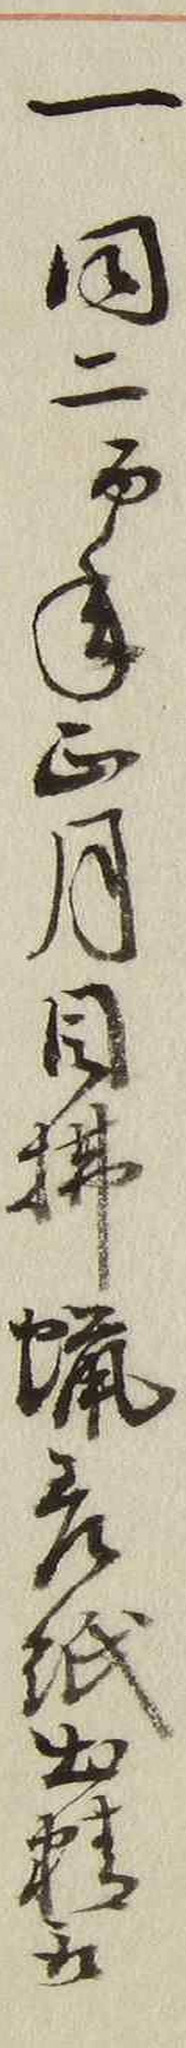一同二酉年正月目払蝋差紙出精取
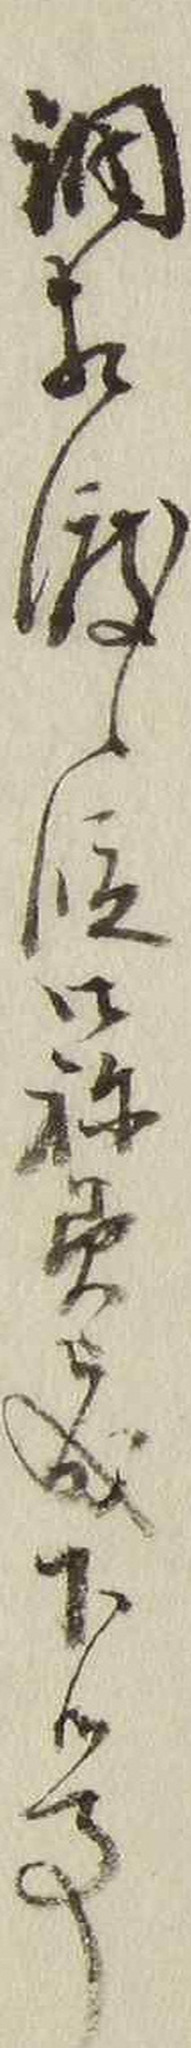調相渡候段御称美被成下候事
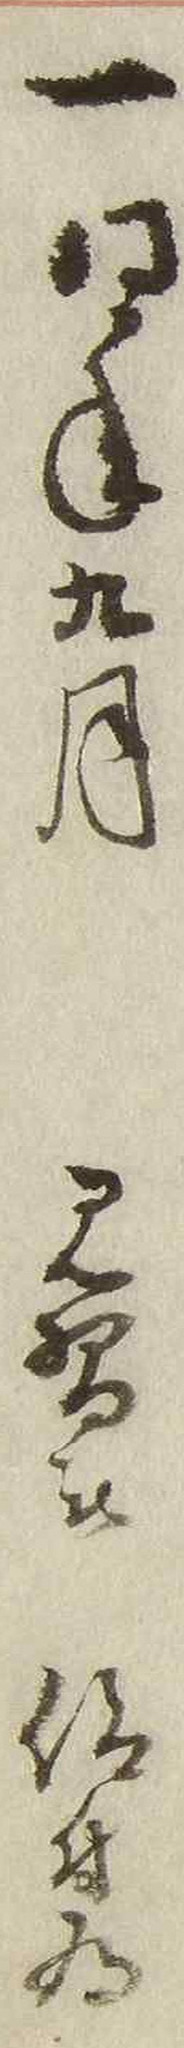一同年九月見習被仰付為

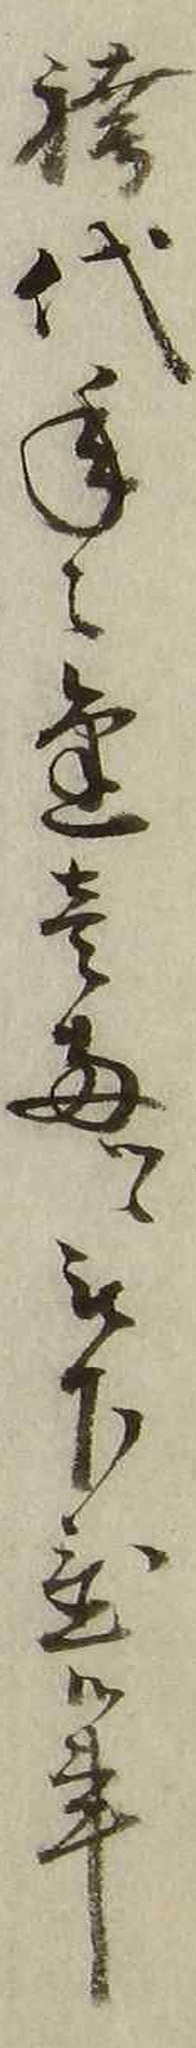袴代年々金壱両ツヽ被下置候事
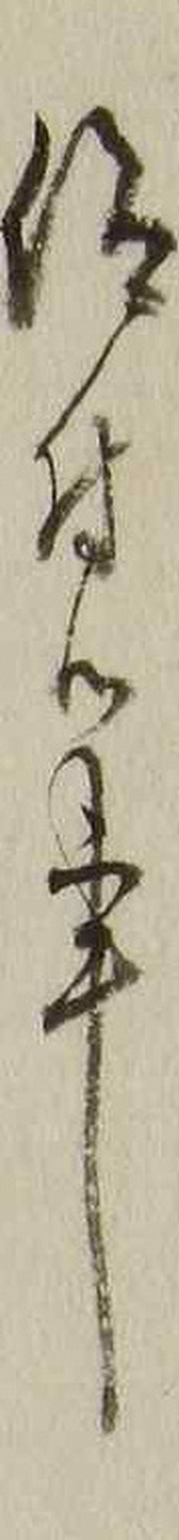仰付候事
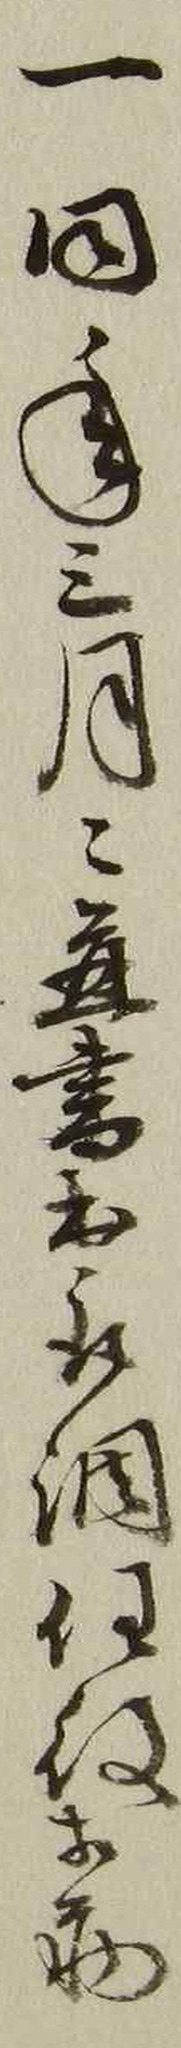一同年三月々並書出取調任役相勤
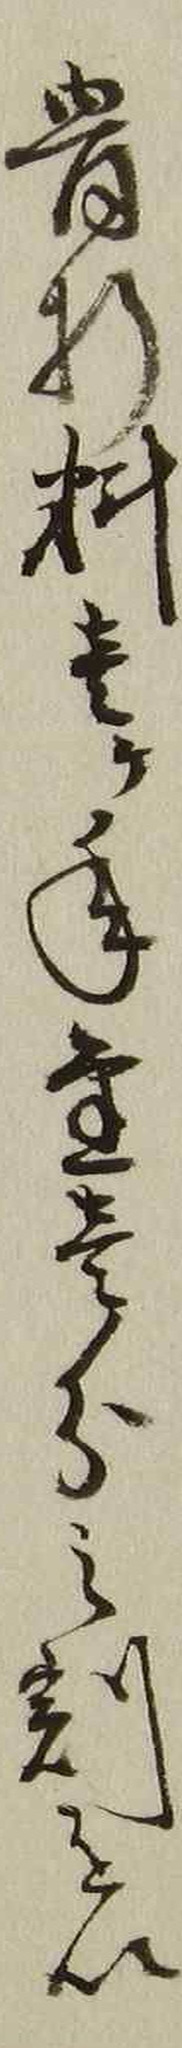骨折料壱ヶ年金壱分之割を以
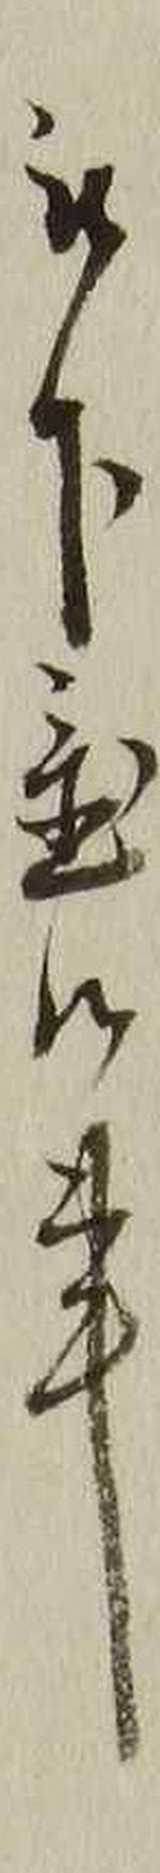被下置候事
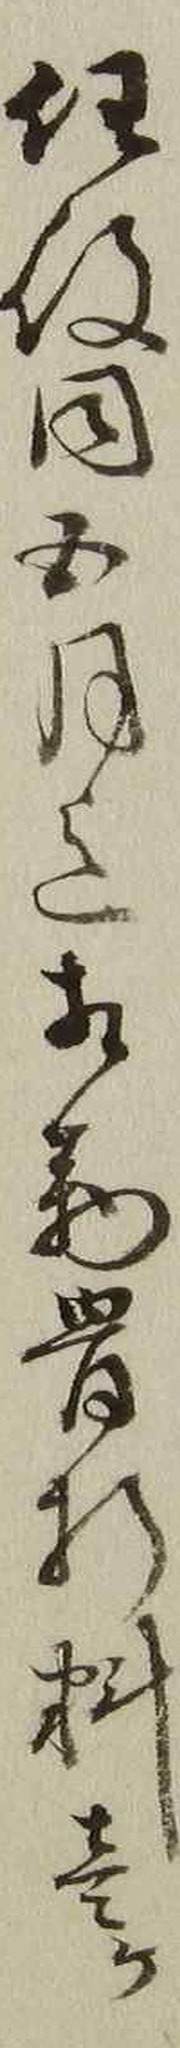任役同五月迄相勤骨折料壱ヶ
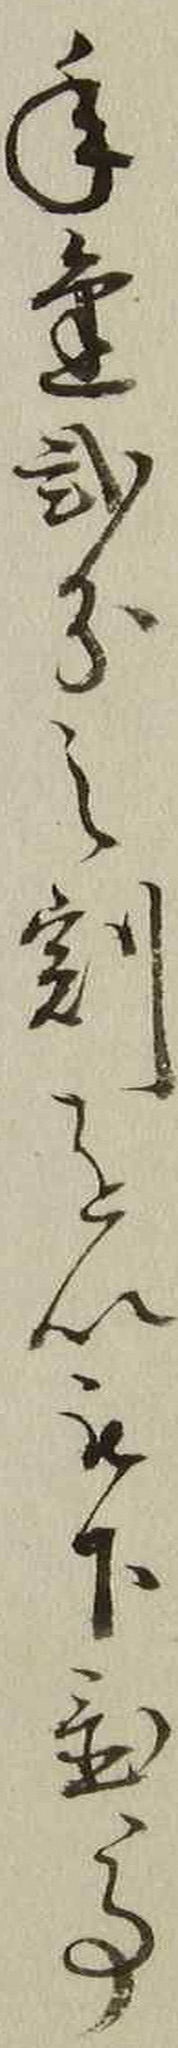年金弐分之割を以被下置候事
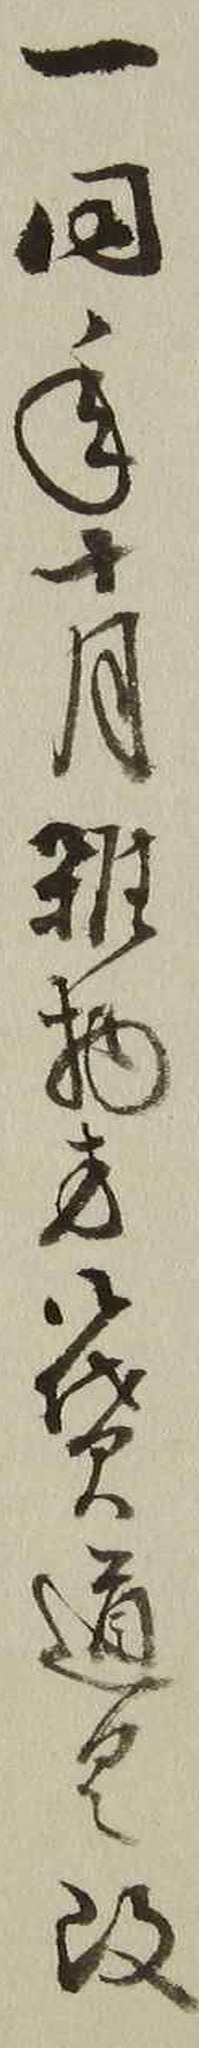一同年十月雑物方御貸道具改
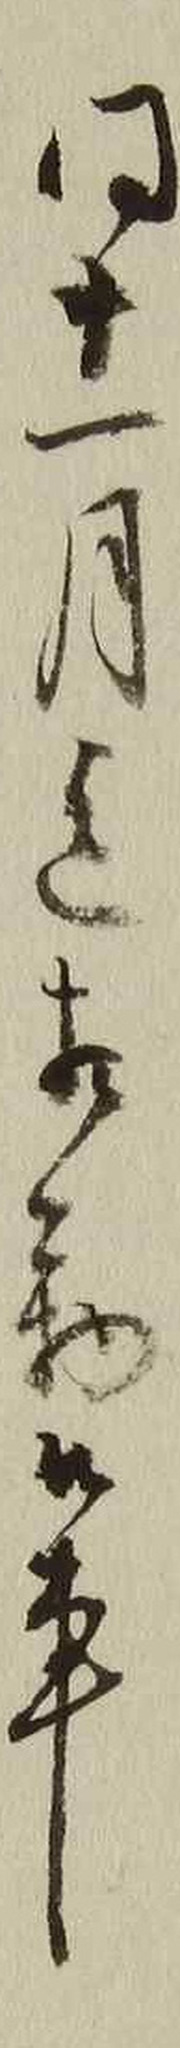同十一月迄相勤候事
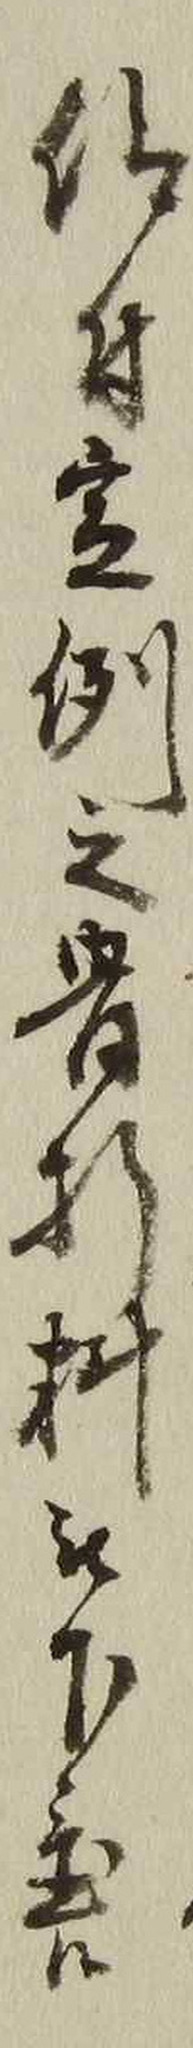仰付定例之骨折料被下置候
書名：諸士系譜　巻之39　は之部7
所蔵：会津若松市立会津図書館
